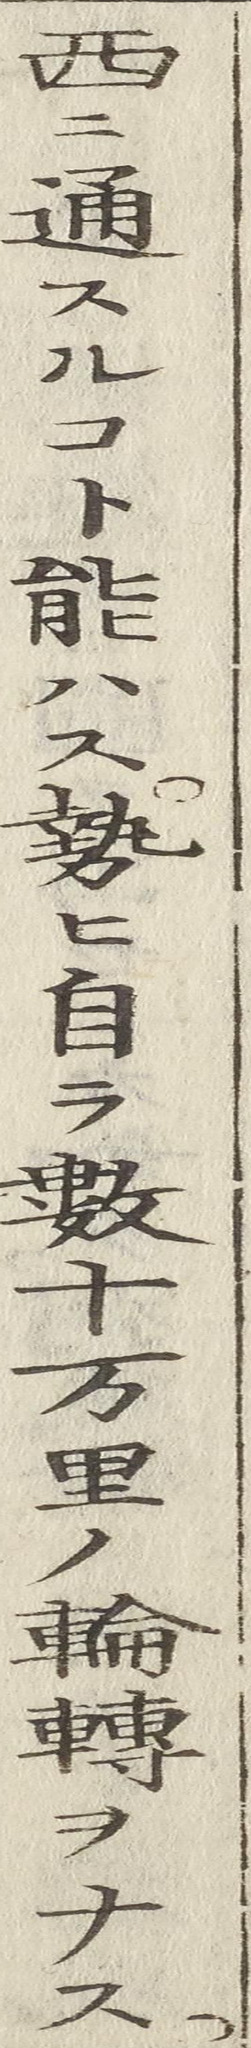西ニ通スルコト能ハス。勢ヒ自ラ数十万里ノ輪転ヲナス。
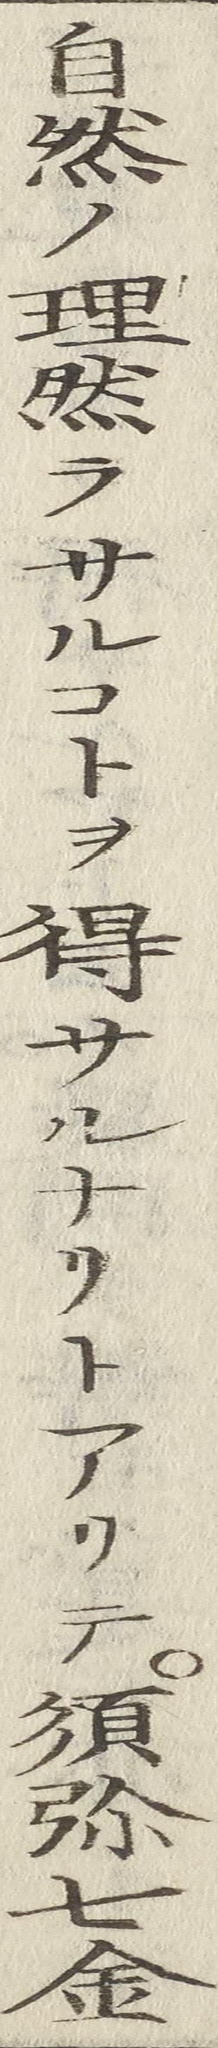自然ノ理然ラサルコトヲ得サルナリトアリテ。須弥七金
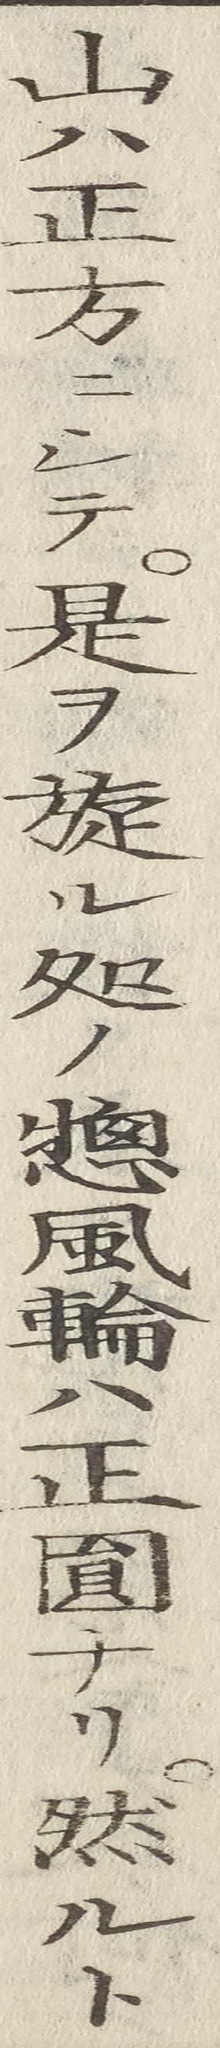山ハ正方ニシテ。是ヲ旋ル処ノ惣風輪ハ正円ナリ。然ルト
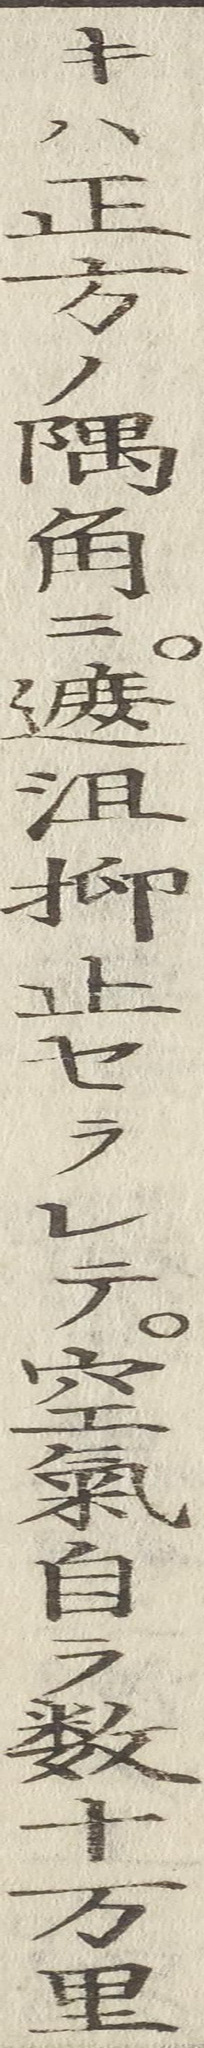キハ正方ノ隅角ニ。遮沮抑止セラレテ。空気自ラ数十万里
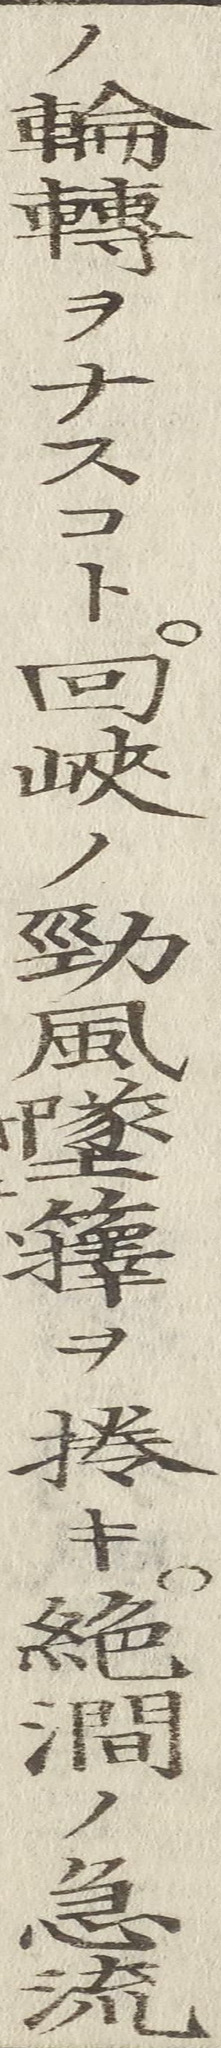ノ輪転ヲナスコト。回峡ノ勁風墜籜ヲ捲キ。絶澗ノ急流
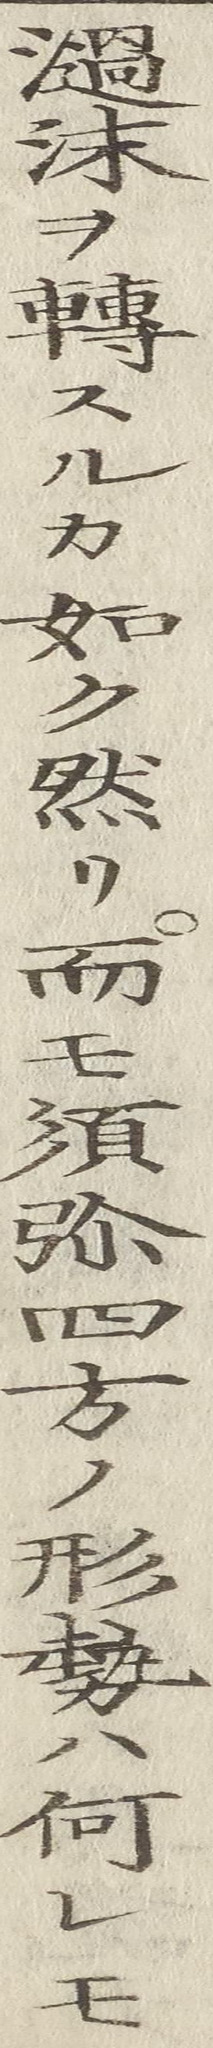渦沫ヲ転スルカ如ク然リ。而モ須弥四方ノ形勢ハ何レモ
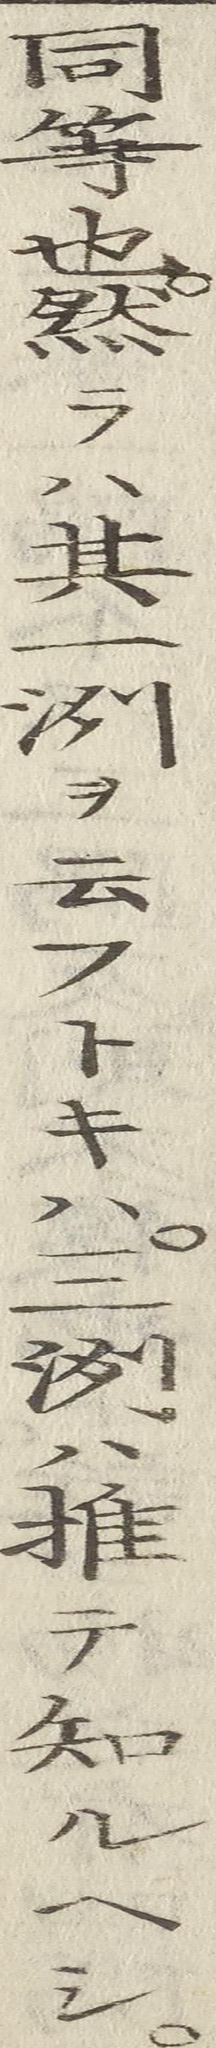同等也。然ラハ其一洲ヲ云フトキハ。三洲ハ推テ知ルヘシ。

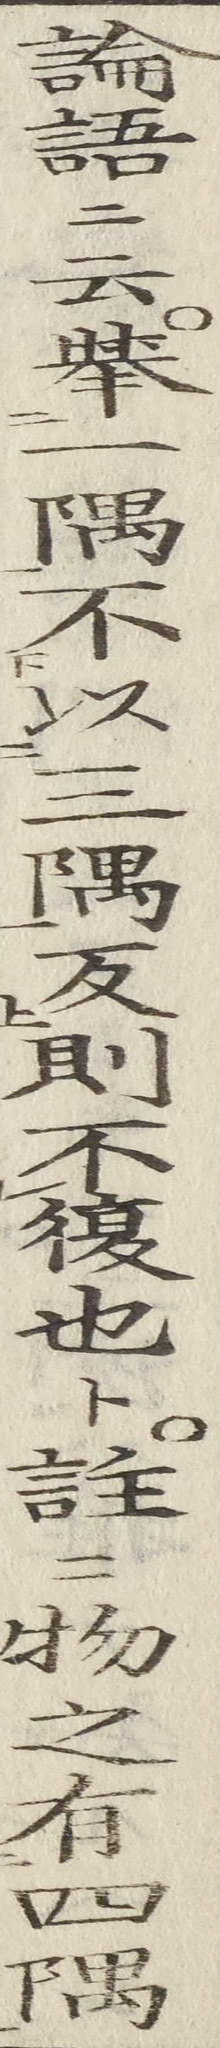論語ニ云。華ニ一隅不以ニ三隅反則不復也ト。註ニ物之有ニ四隅
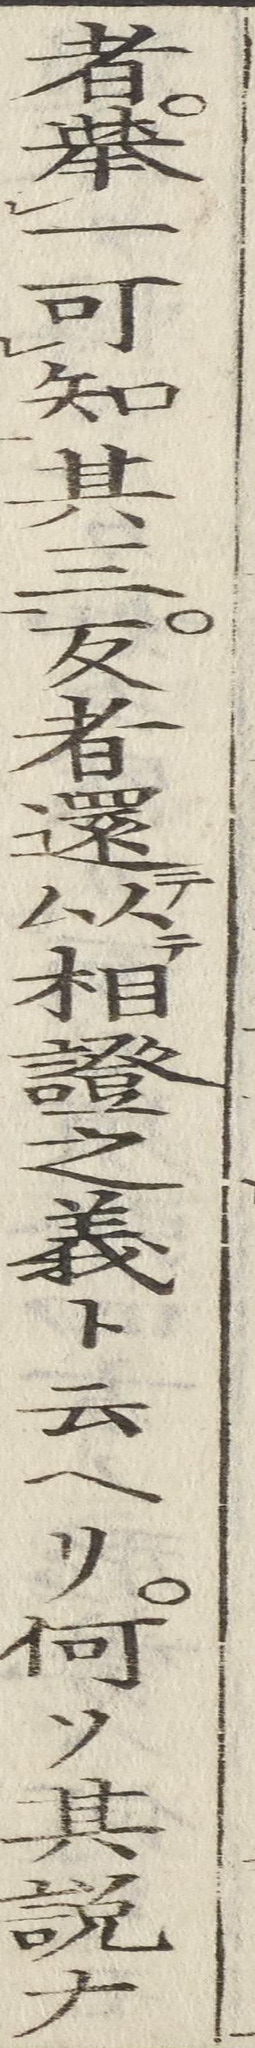者。華一可知ニ其三。反者還以相証之義ト云ヘリ。何ソ其説ナ
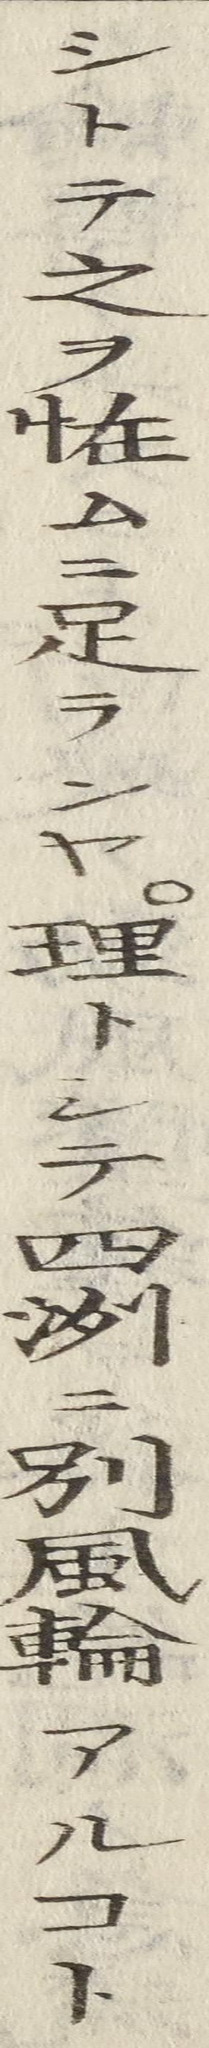シトテ之ヲ恠ムニ足ランヤ。理トシテ四洲ニ別風輪アルコト
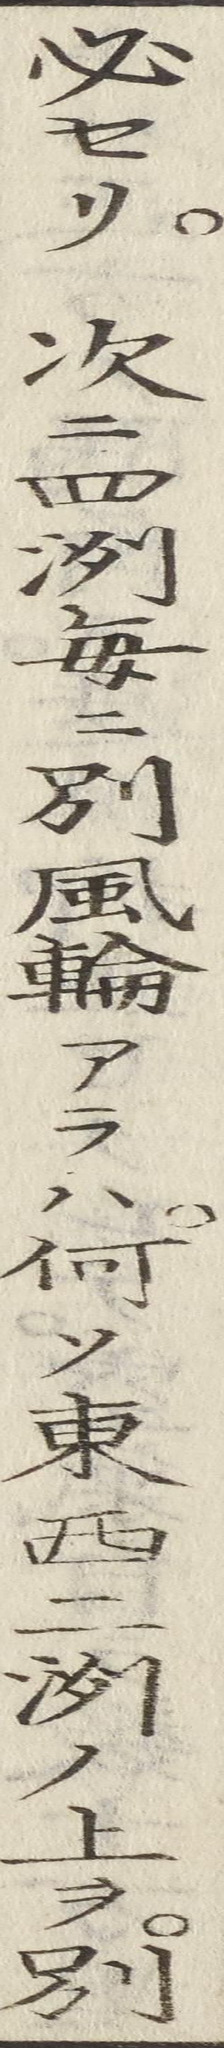必セリ。次ニ四洲毎ニ別風輪アラハ。何ソ東西ニ洲ノ上ヲ。別
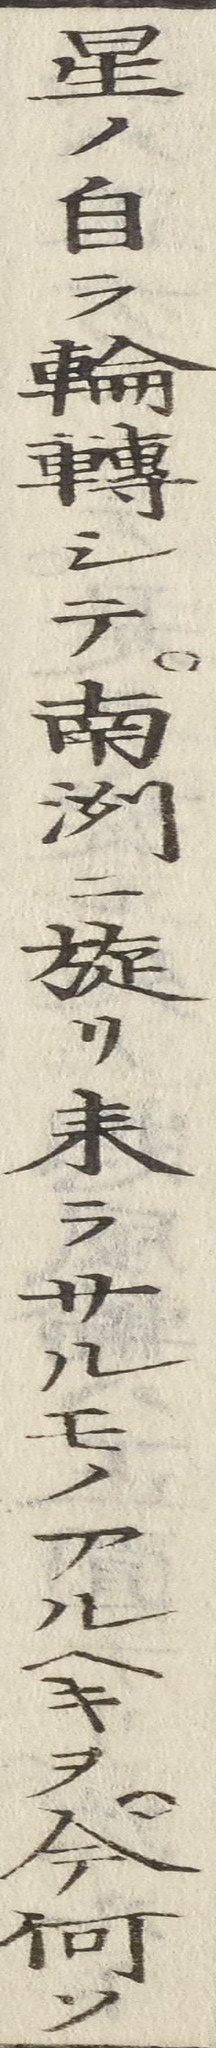星ノ自ラ輪転シテ。南洲ニ旋リ来ラサルモノアルヘキヲ。今何ソ
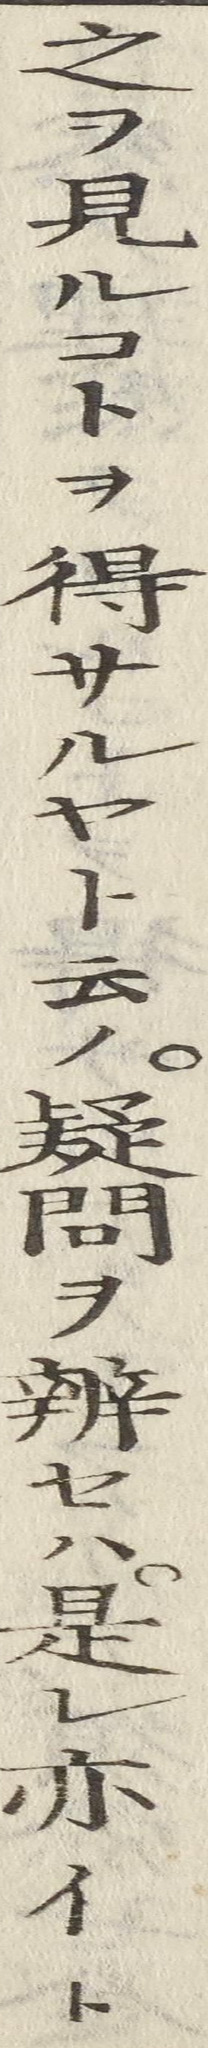之ヲ見ルコトヲ得サルヤト云ノ。疑問ヲ弁セハ。是レ亦イト
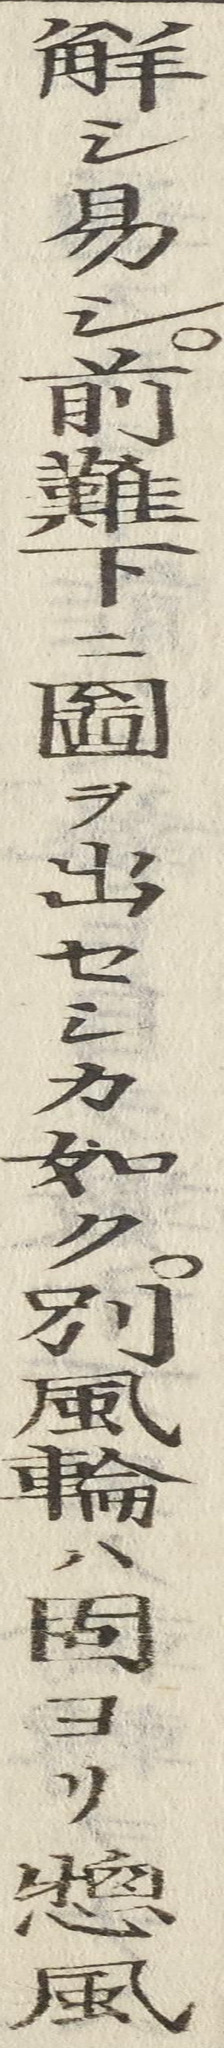觧シ易シ。前難下ニ図ヲ出セシカ如ク。別風輪ハ固ヨリ惣風
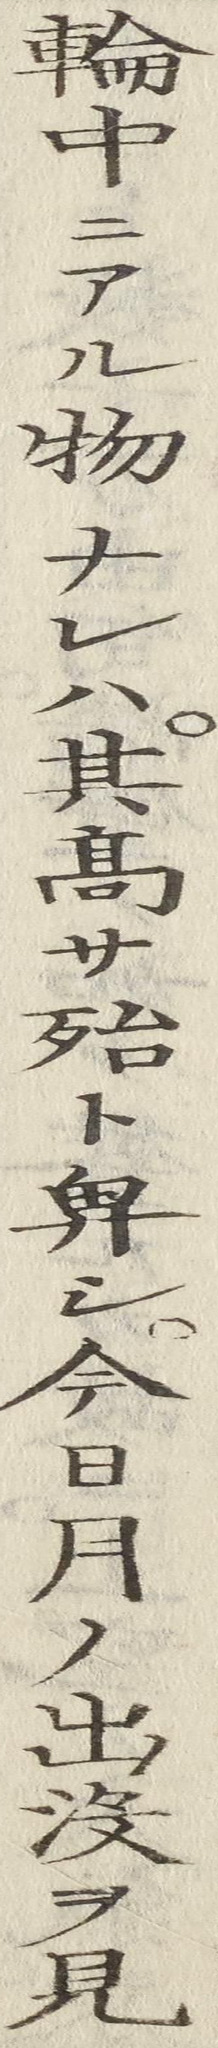輪中ニアル物ナレハ。其高サ殆ト卑シ。今日月ノ出没ヲ見
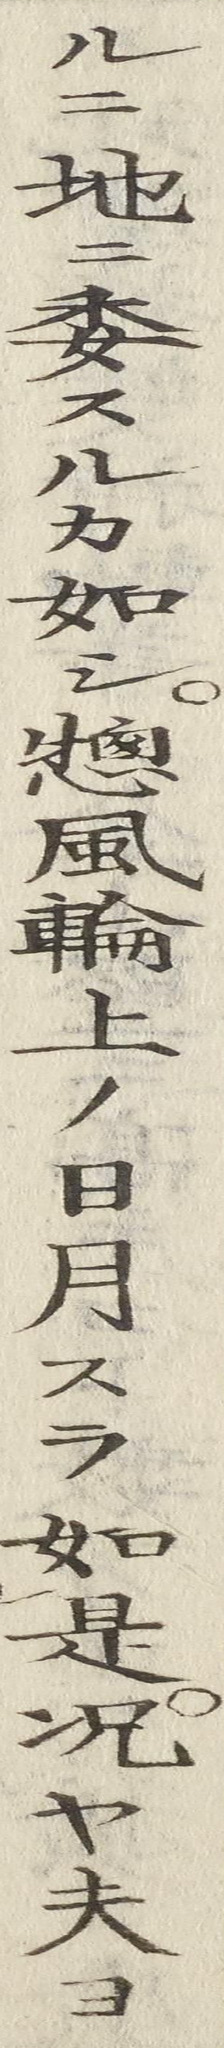ルニ地ニ委スルカ如シ。惣風輪上ノ日月スラ如是。況ヤ夫ヨ
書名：護法新論　二編　上
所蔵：東京大学地震研究所図書室 Earthquake Research Institute Library, The University of Tokyo, JAPAN
